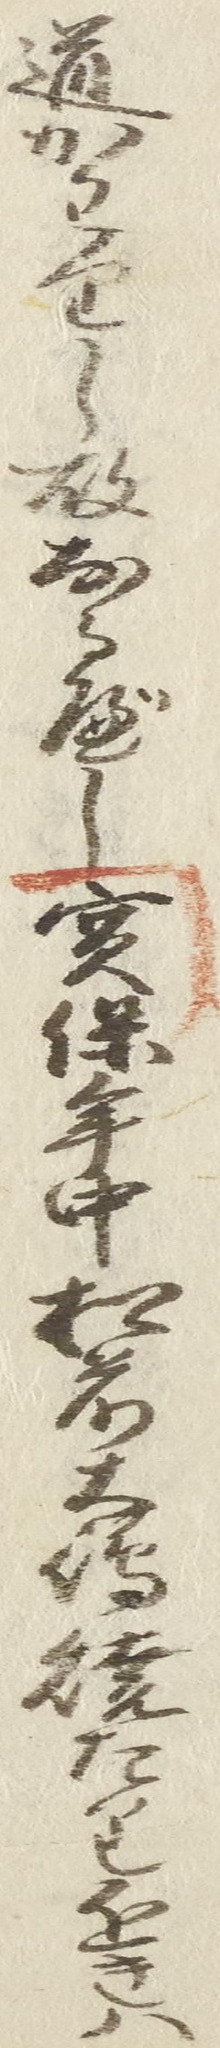道かわりし故なるべし「寛保年中松前大嶋焼たり近きは
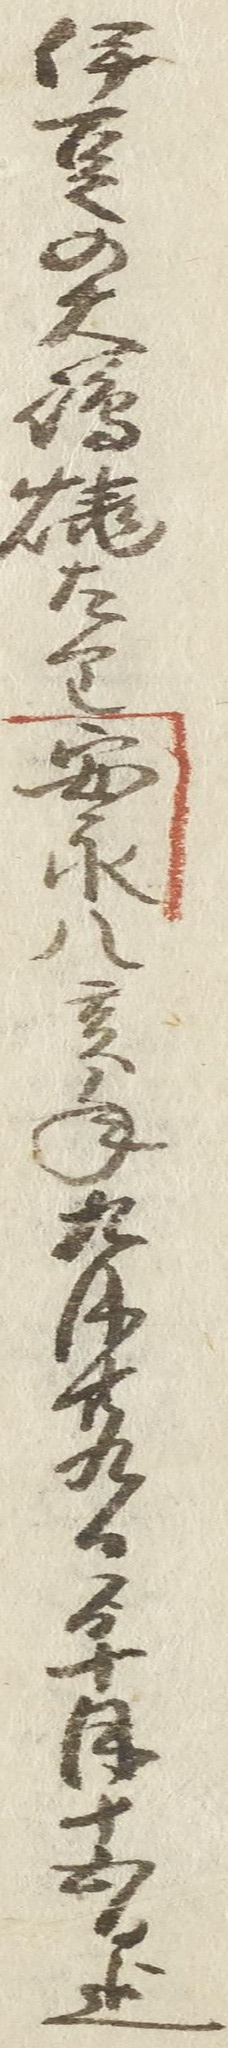伊豆の大嶋焼たり「安永八亥年九月廿九日ゟ十月十五日迄
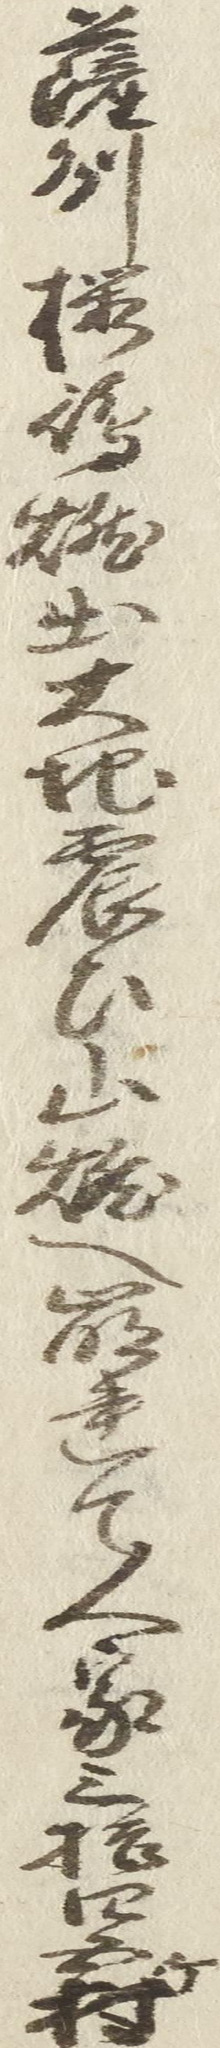薩洲桜嶋焼出大地震ひ山燃へ崩れて人家三拾四五ヶ村
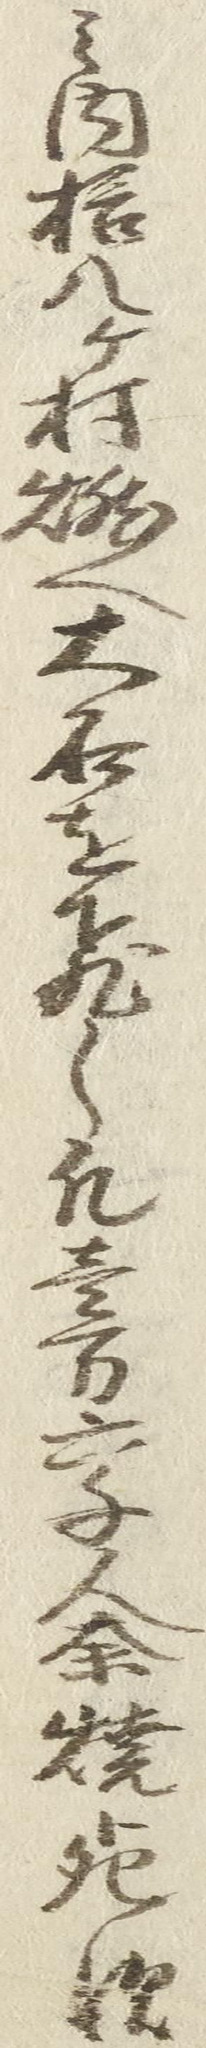之内拾八ヶ村燃へ大石を飛し凡壱万六千人余焼死す
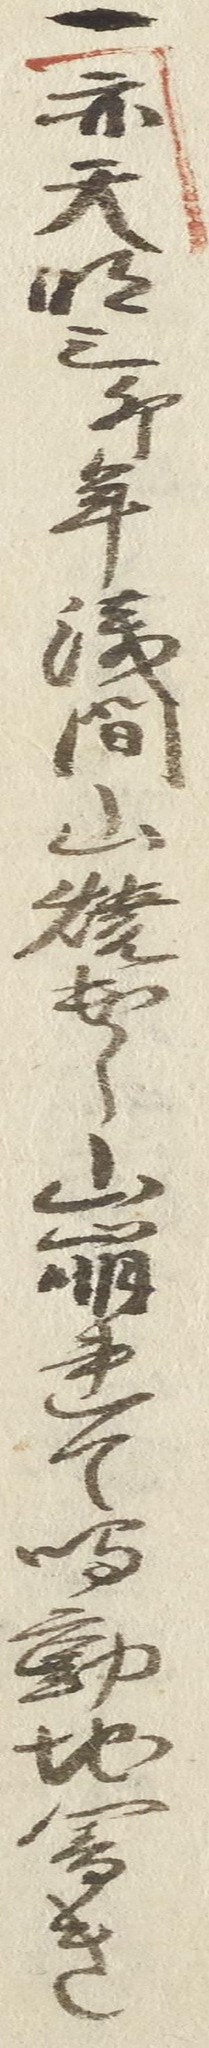一「亦天明三卯年浅間山焼出し山崩れて鳴動地響き
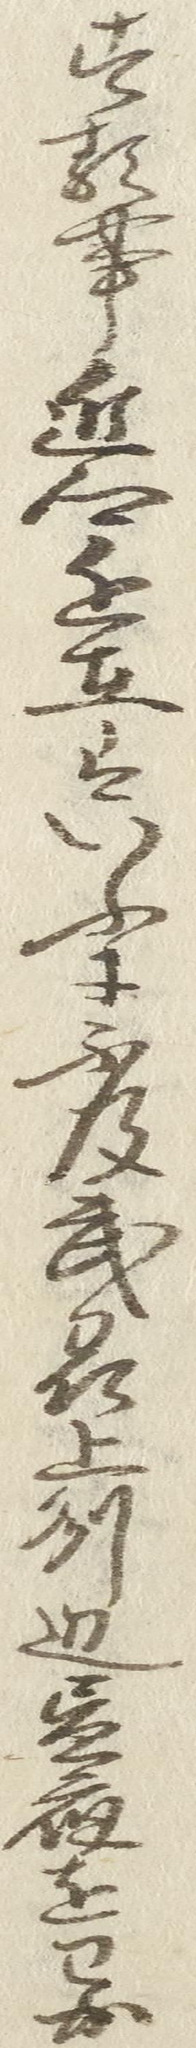する事近郷近在はいふに不及武州上州辺昼夜をわか
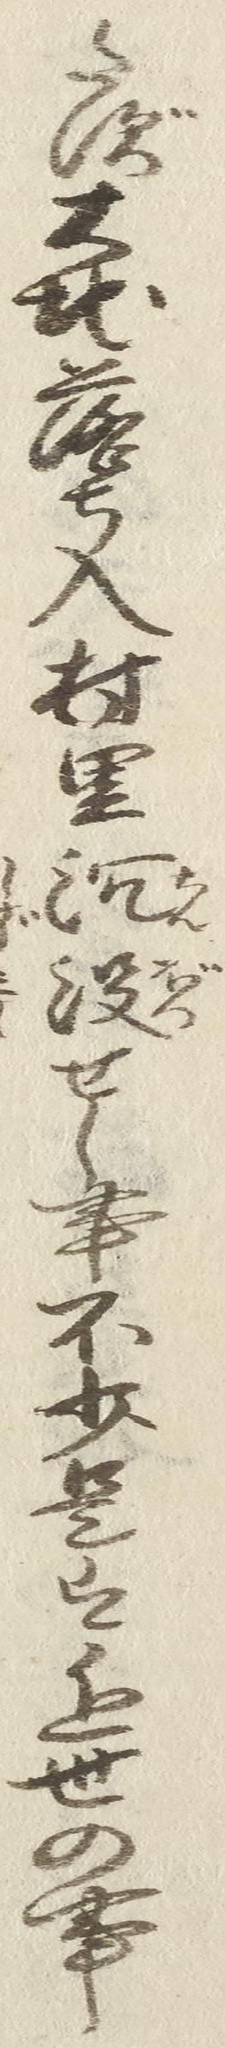たす大地落ち入村里沈没せし事不少是は近世の事
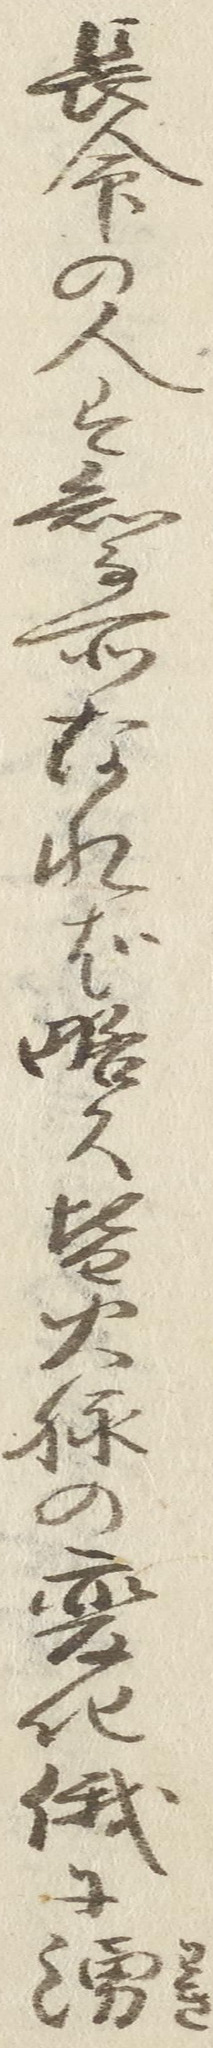長命の人は知る所なれば略す皆火抔の変化俄に湧
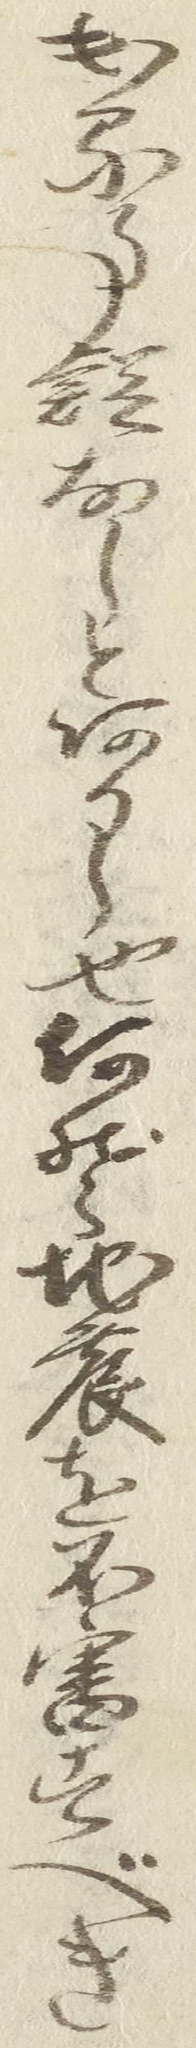出る事疑なしとありし也何から地震を不審すべき
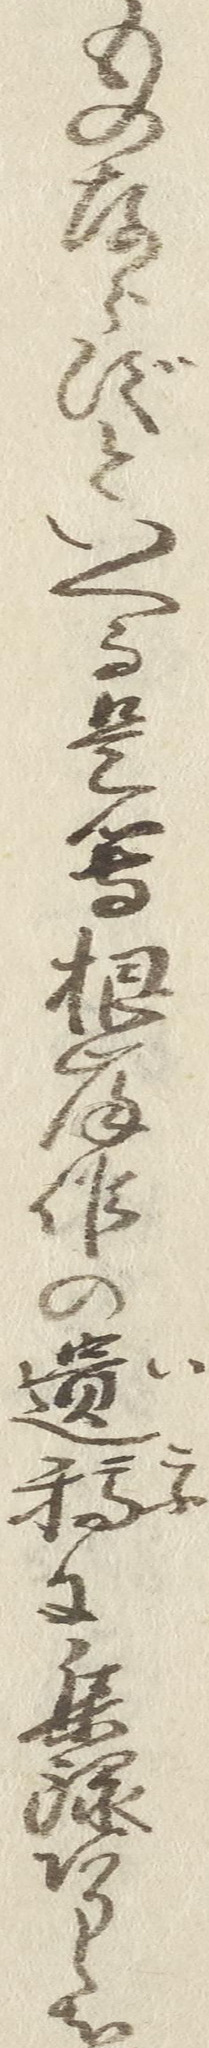ものならずといへる是等根岸侯の遺稿に集録ありを
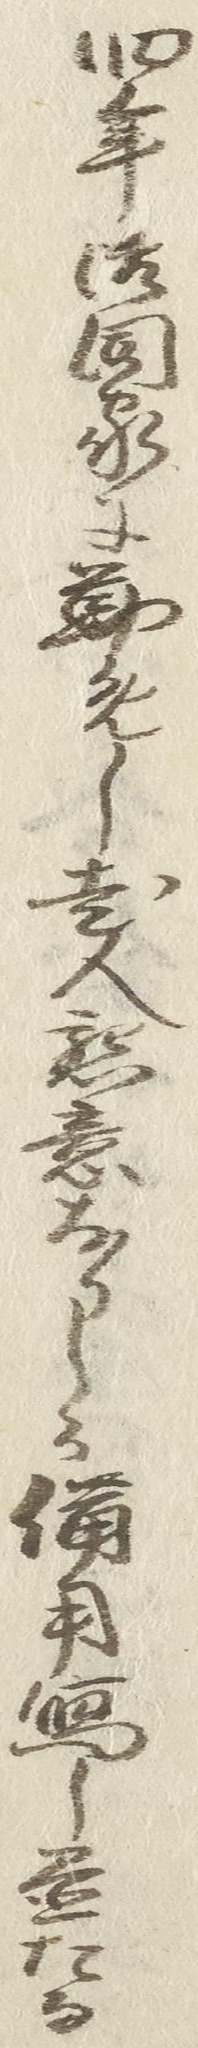旧年御同家に勤めし老人懇意なりしか備用写し置たる
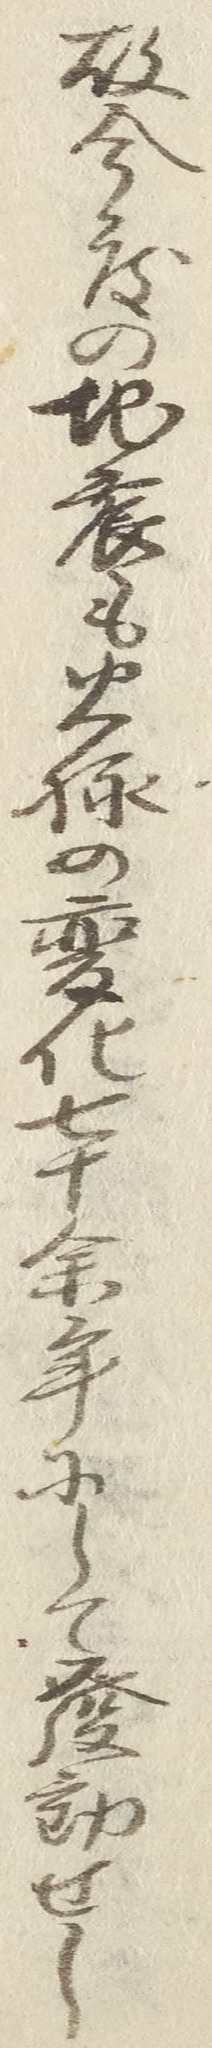故今度の地震も火様の変化七十余年にして発動せし
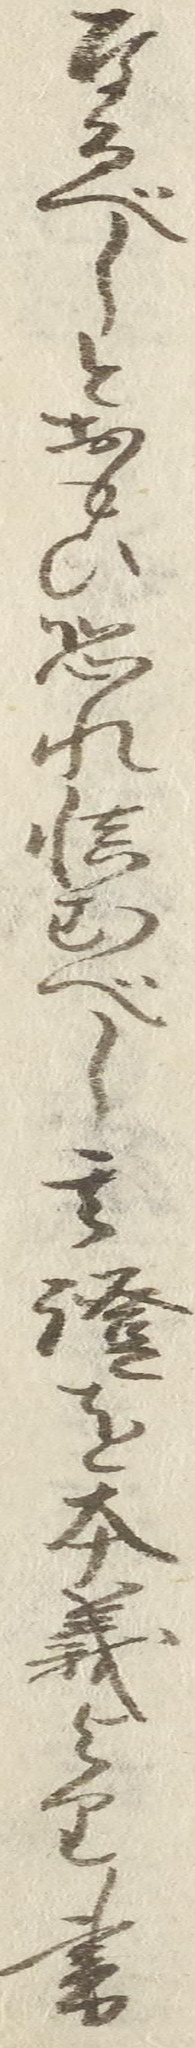なるべしとおもひ恐れ慎むべし其の證を本義より書
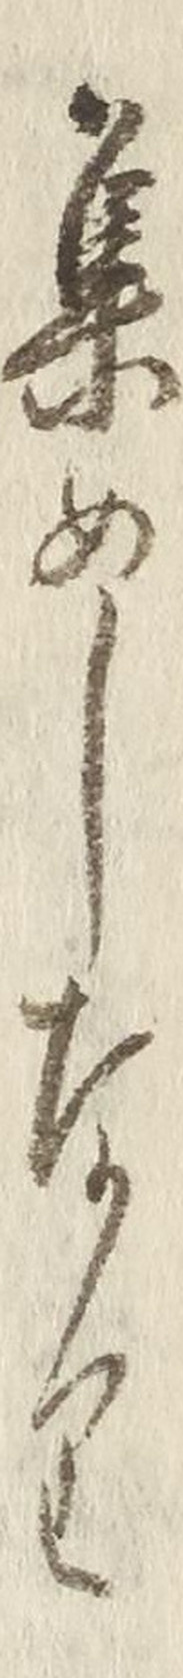集めしなり

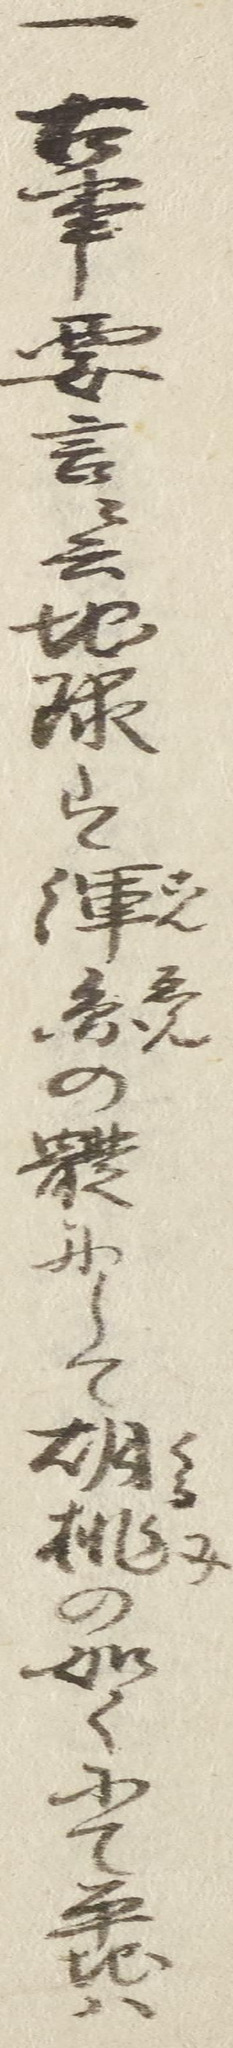一古事要言に云地脈は渾円の体にして胡桃の如くにて平地は
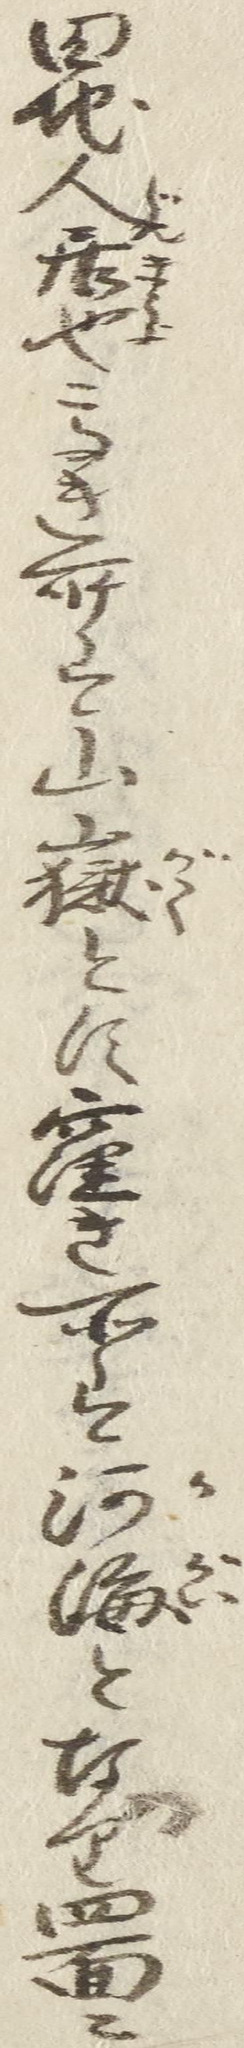田地人居や高き所は山嶽とす窪き所は河海となり四面に
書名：従往古地震御届書記誌之一
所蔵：東京大学地震研究所図書室 Earthquake Research Institute Library, The University of Tokyo, JAPAN
